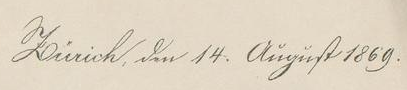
Zürich, den 14. August 1869.
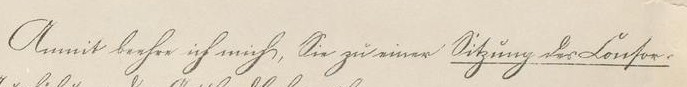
Anmit beehre ich mich, Sie zu einer Sitzung des Consor-
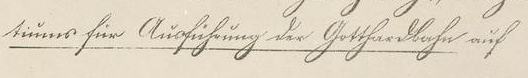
tiums für Ausführung der Gotthardbahn auf
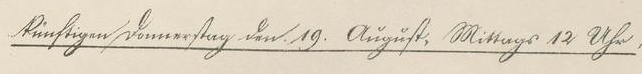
künftigen Donnerstag den 19. August, Mittags 12 Uhr,
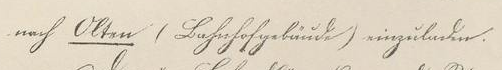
nach Olten (Bahnhofgebäude) einzuladen.
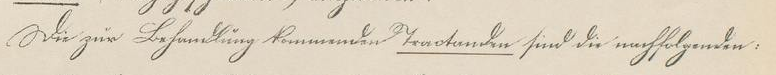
Die zur Behandlung kommender Tractanden sind die nachfolgenden:
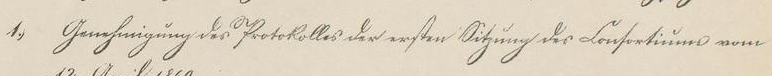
1.) Genehmigung des Protokolles der ersten Sitzung des Consortiums vom
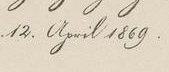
12. April 1869.
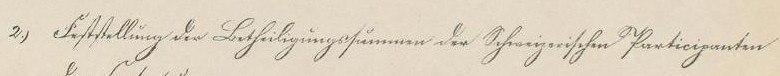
2.) Feststellung der Betheiligungssummen der Schweizerischen Participanten
